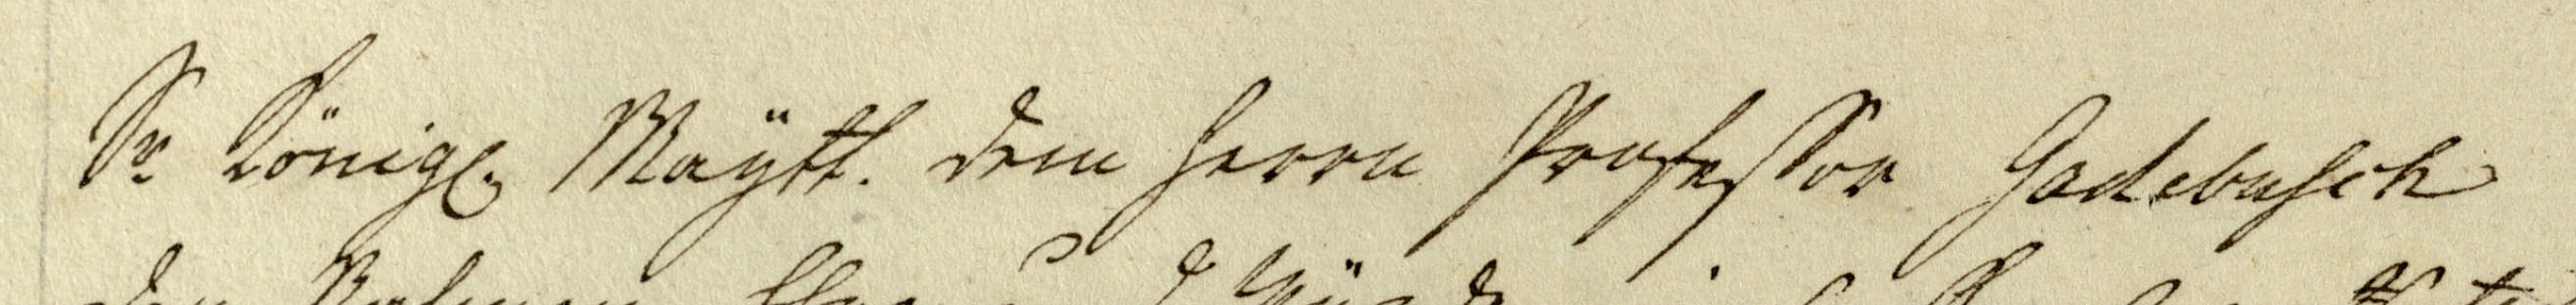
Sr Königl. Maÿtt. dem Herrn Professor Gadebusch
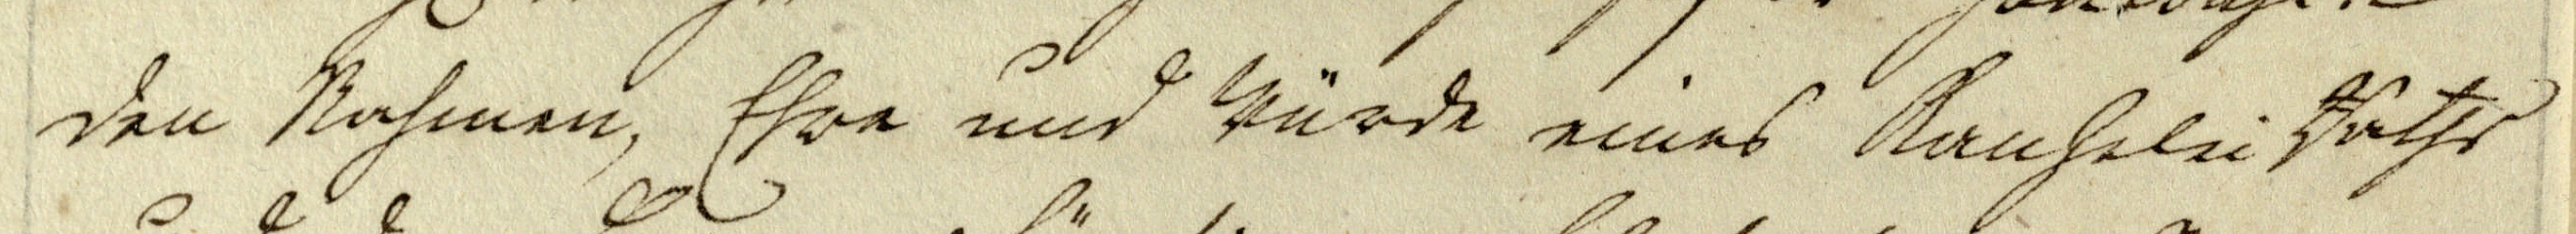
den Nahmen, Ehre und Würde eines Kanzelei Raths
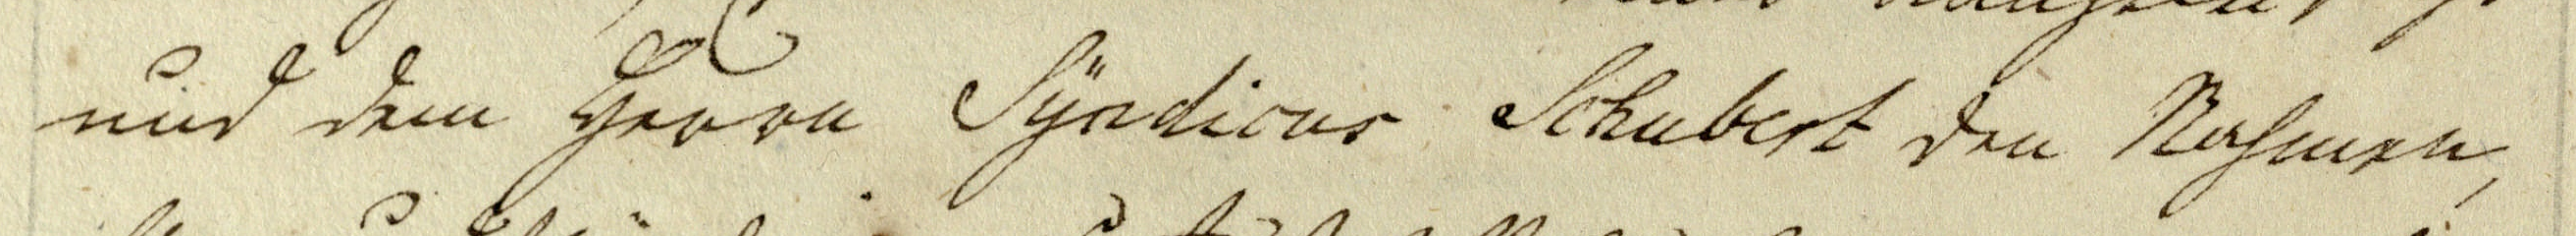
und dem Herrn Sÿndicus Schubert den Nahmen,
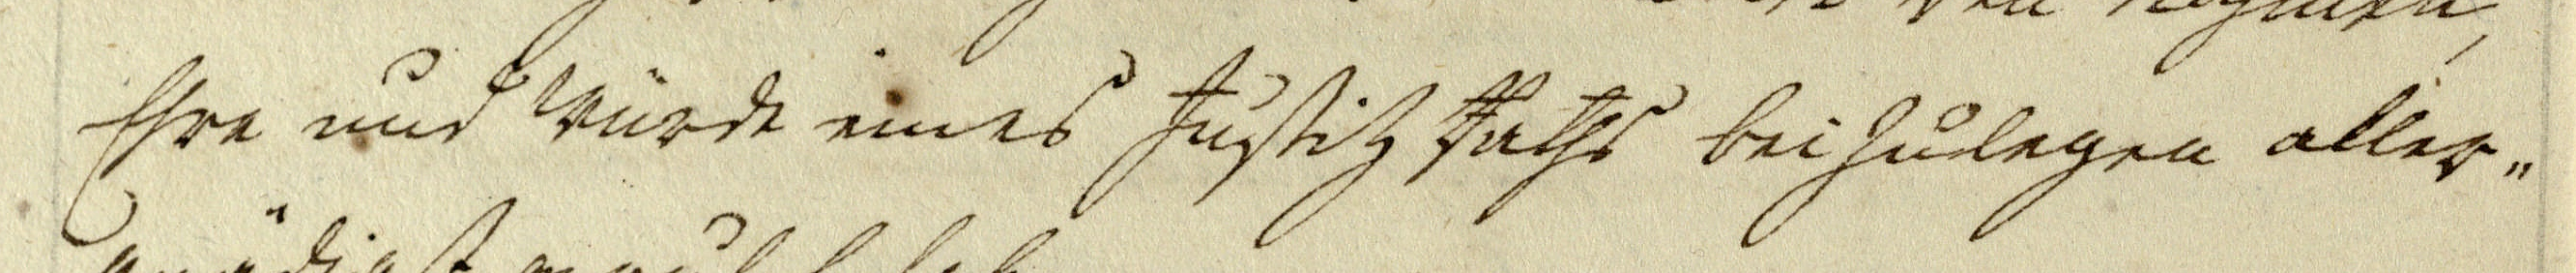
Ehre und Würde eines Justiz Raths beizulegen aller¬
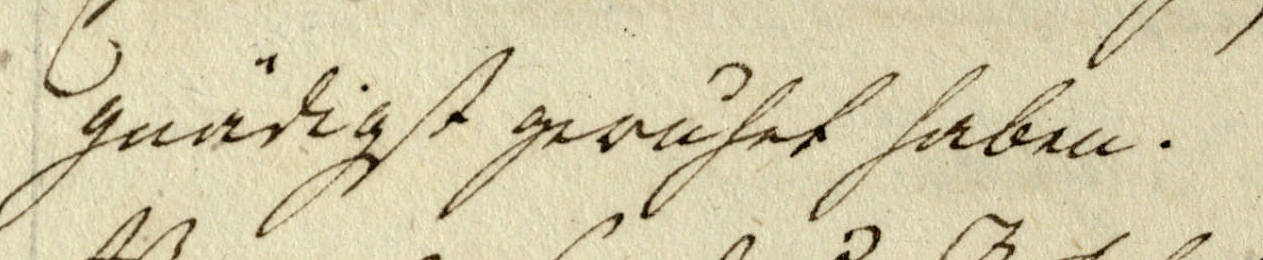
gnädigst geruhet haben.
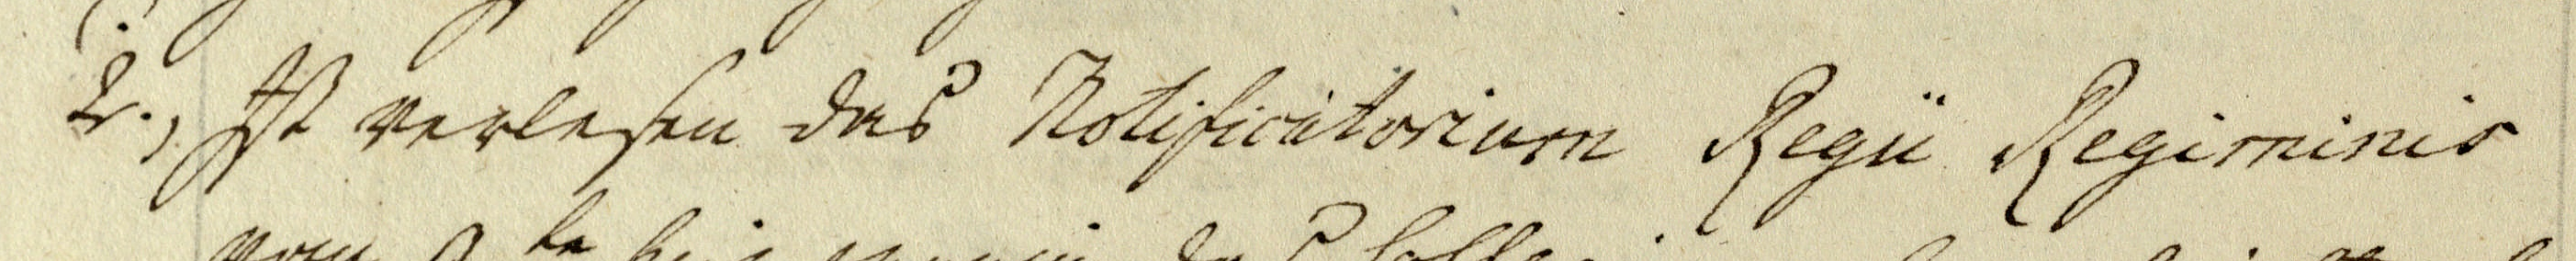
2., Ist verlesen das Notificatorium Regii Regiminis
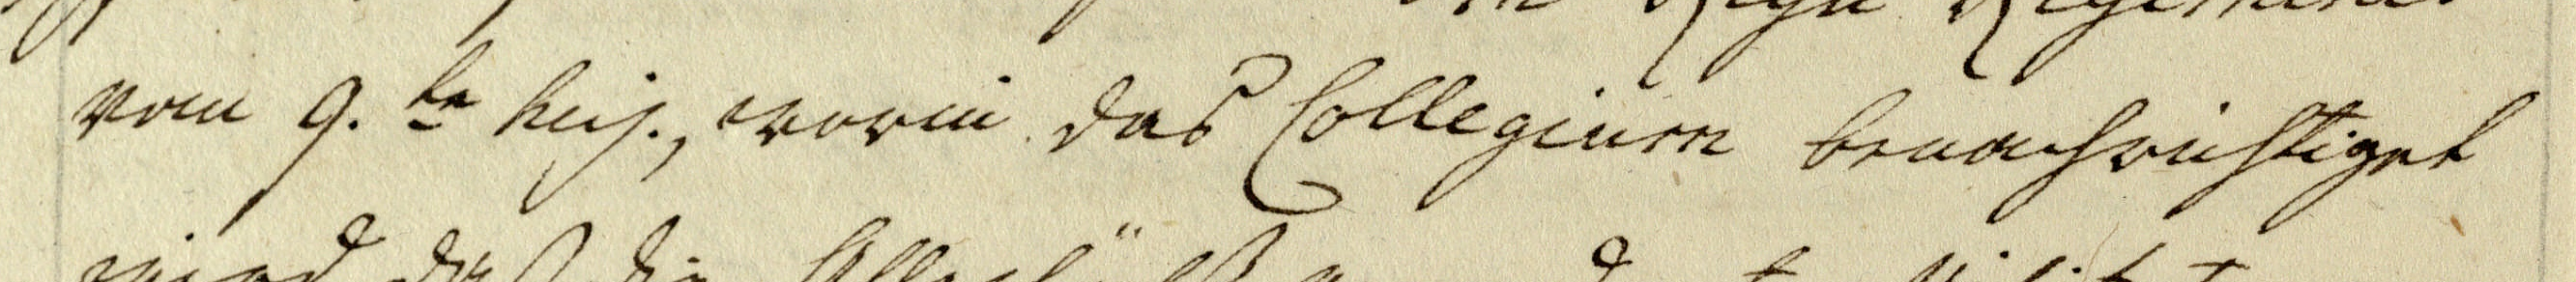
vom 9. huj., worin das Collegium benachrichtiget
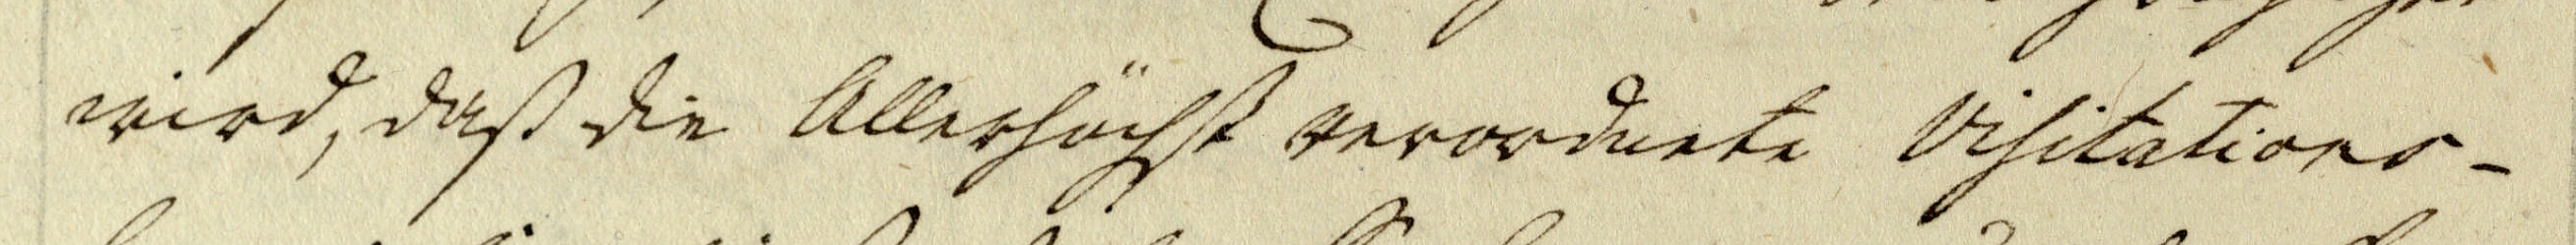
wird, daß die Allerhöchst verordnete Visitations-
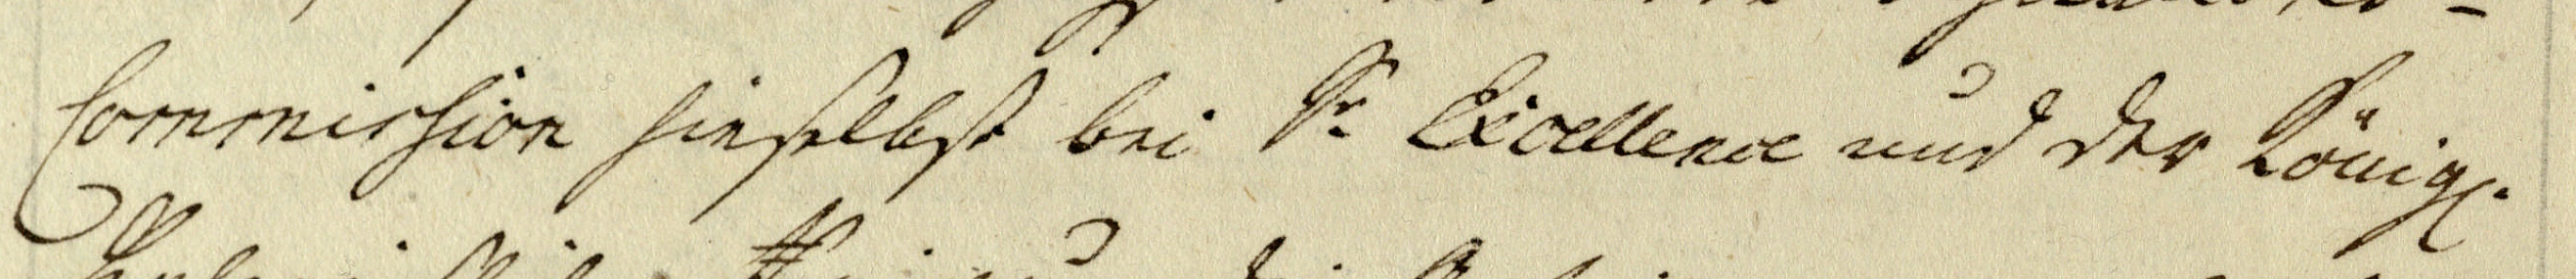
Commission hieselbst bei Sr Excellence und der Königl.
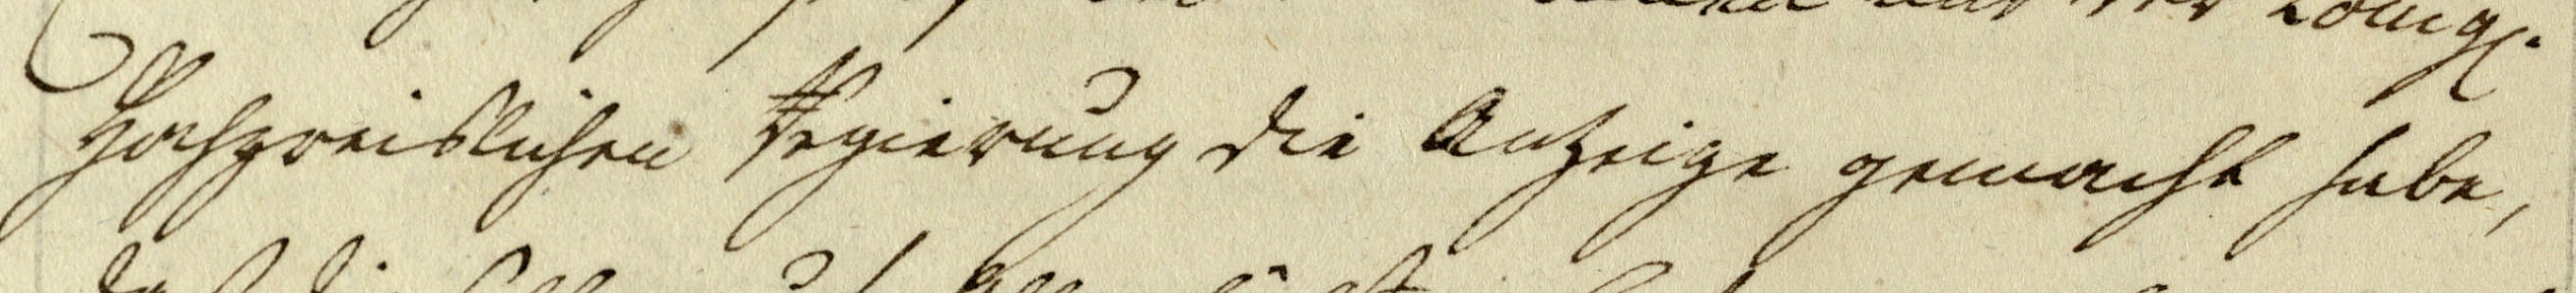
Hochpreislichen Regierung die Anzeige gemacht habe,
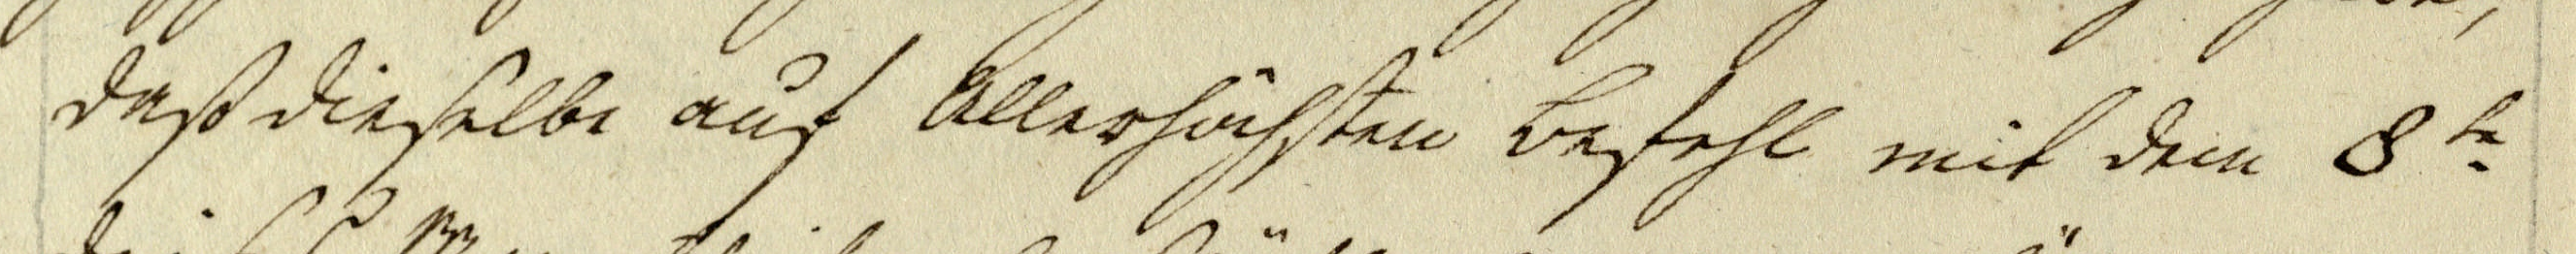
daß dieselbe auf Allerhöchsten Befehl mit dem 8 te
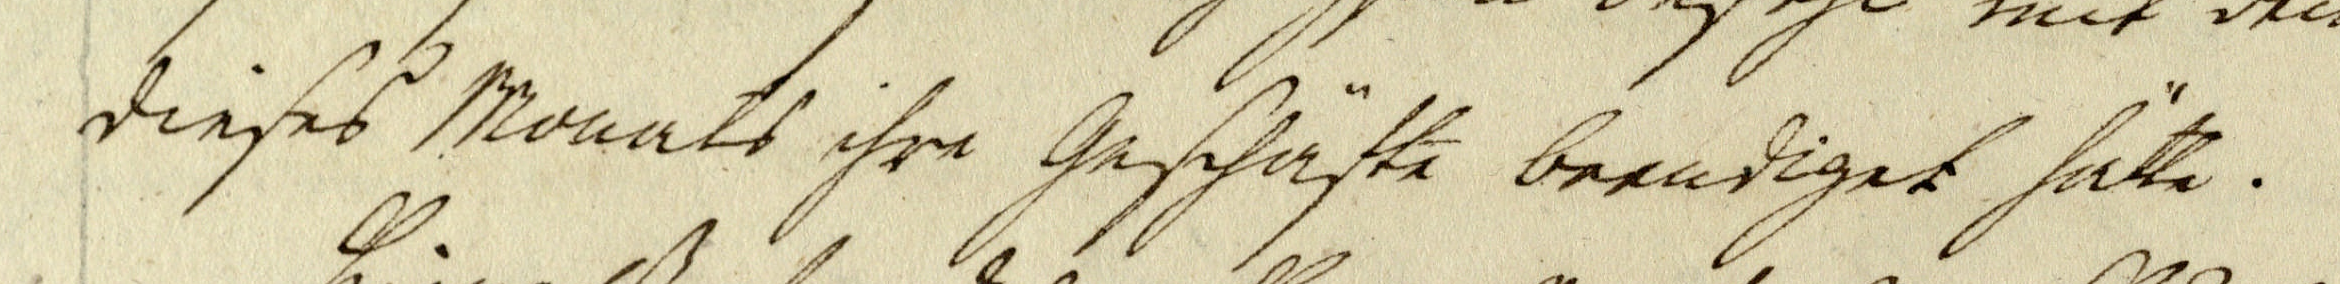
dieses Monats ihre Geschäfte beendiget hätte.
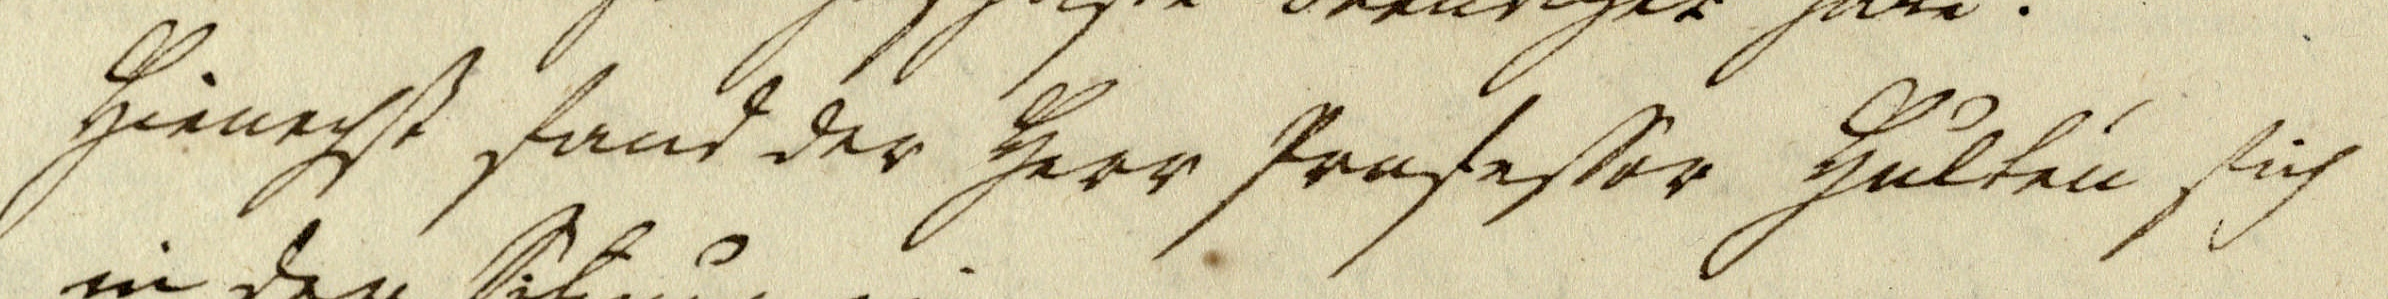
Hienechst fand der Herr Professor Hultén sich
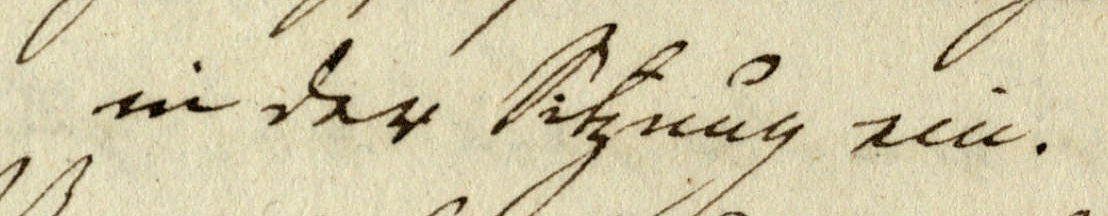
in der Sitzung ein.
